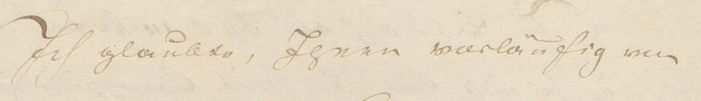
Ich glaubte, Ihnen vorläufig von
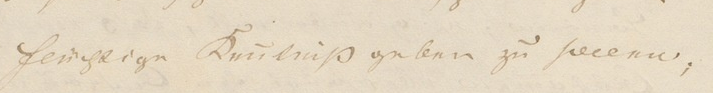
flüchtige Kenntniß geben zu sollen;
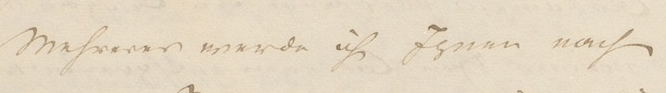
Mehreres werde ich Ihnen nach
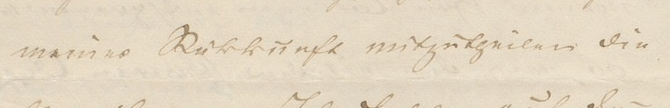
meiner Rükkunft mitzutheilen die
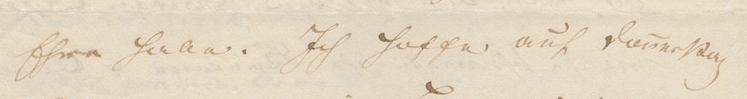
Ehre haben. Ich hoffe auf Donnerstag
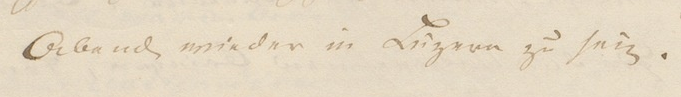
Abend wieder in Luzern zu sein.
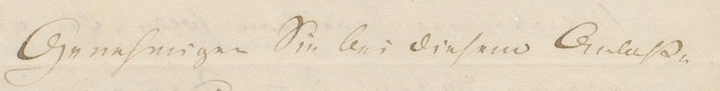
Genehmignen Sie bei diesem Anlaße
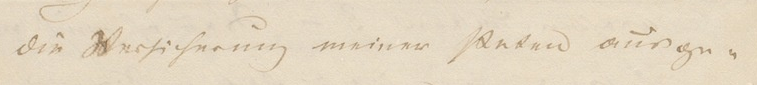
die Versicherung meiner steten ausge-
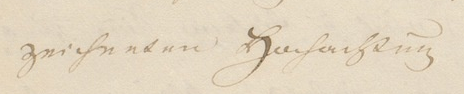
zeichneten Hochachtung
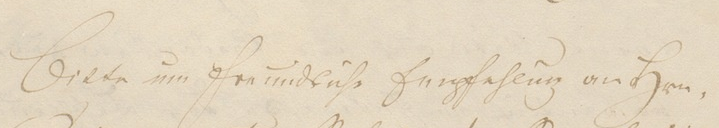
Bitte um freundliche Empfehlung an Hrn.
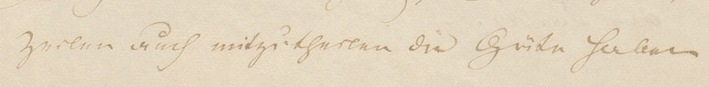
Zeilen auch mitzutheilen die Güte haben
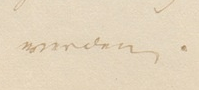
werden.
